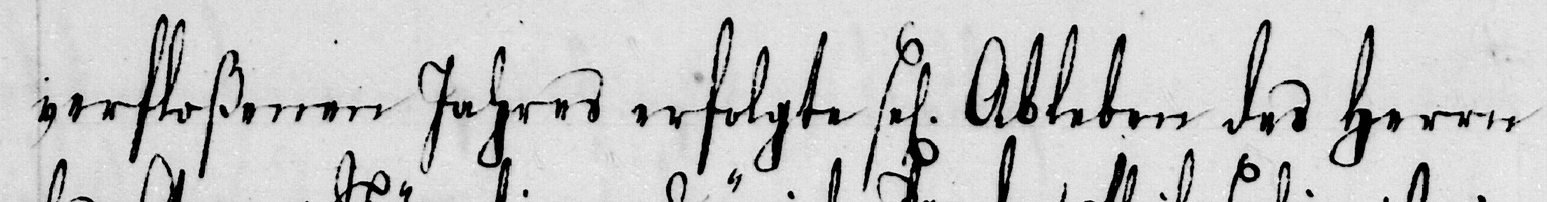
verfloßenen Jahres erfolgte sel. Ableben des Herrn
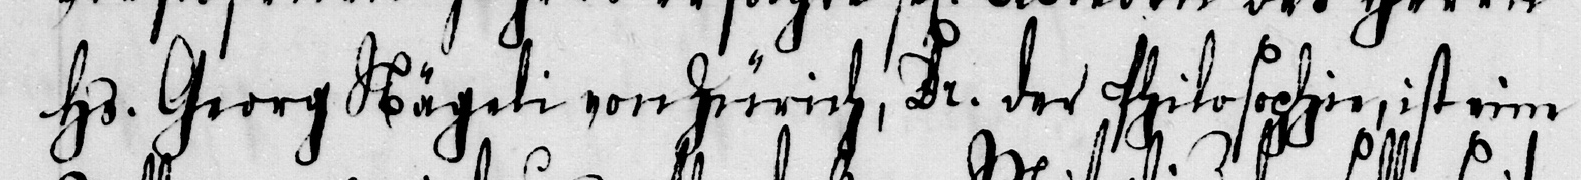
Hs. Georg Nägeli von Zürich, Dr. der Philosophie, ist eine
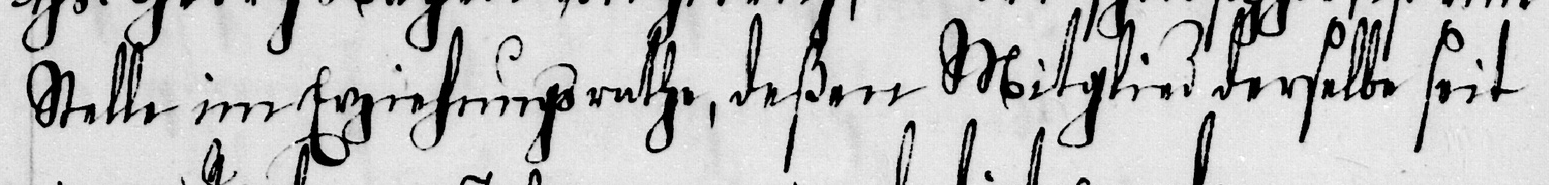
Stelle im Erziehungsrathe, deßen Mitglied derselbe seit
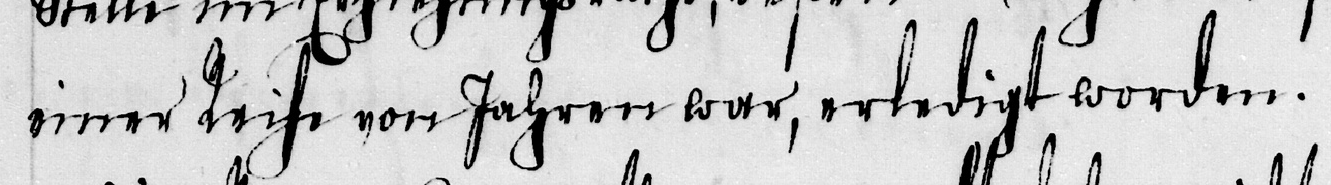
einer Reihe von Jahren war, erledigt worden.
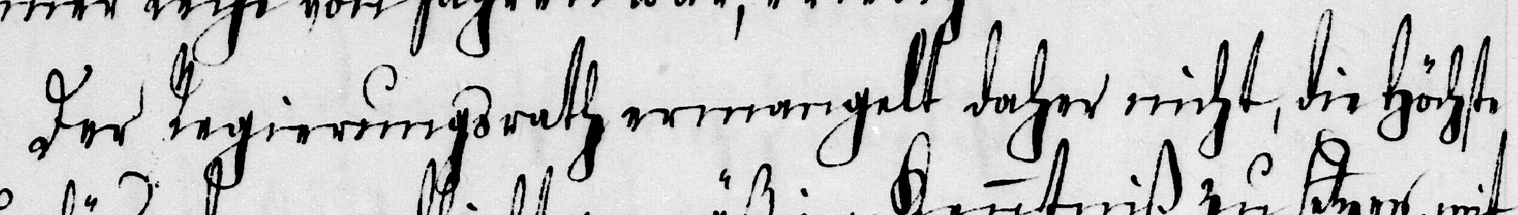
Der Regierungsrath ermangelt daher nicht, die höchs¬
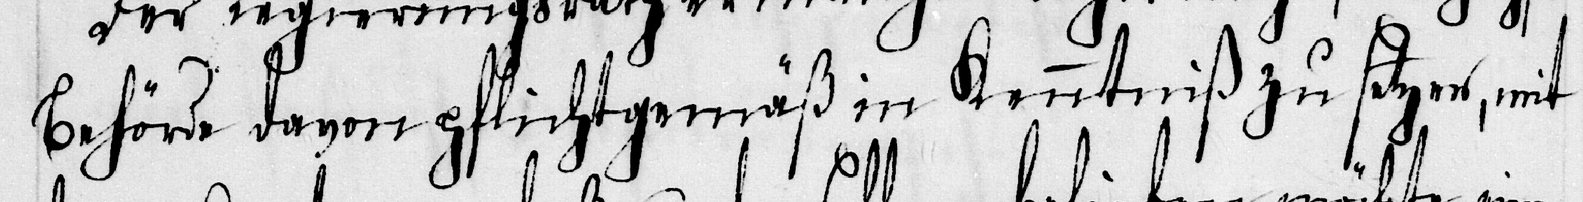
Behörde davon pflichtgemäß in Kenntniß zu setzen, mit
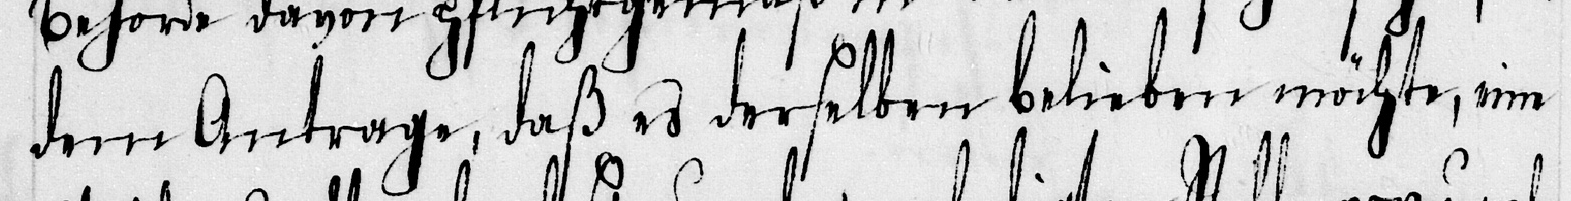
dem Antrage, daß es derselben belieben möchte, eine
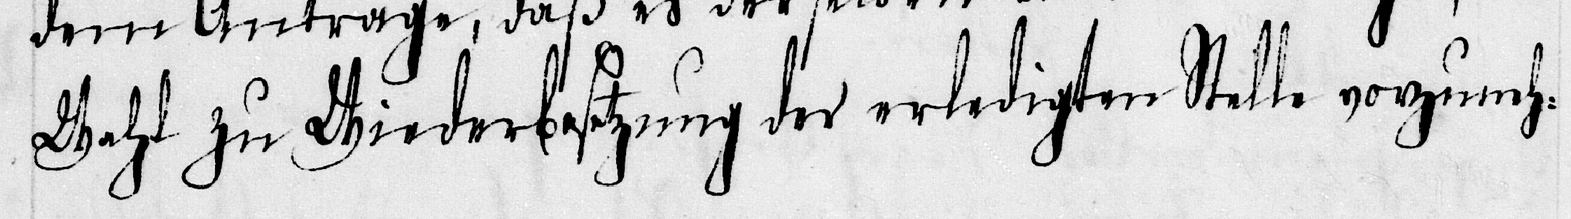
Wahl zu Wiederbesetzung der erledigten Stelle vorzuneh¬
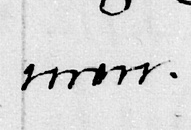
men.
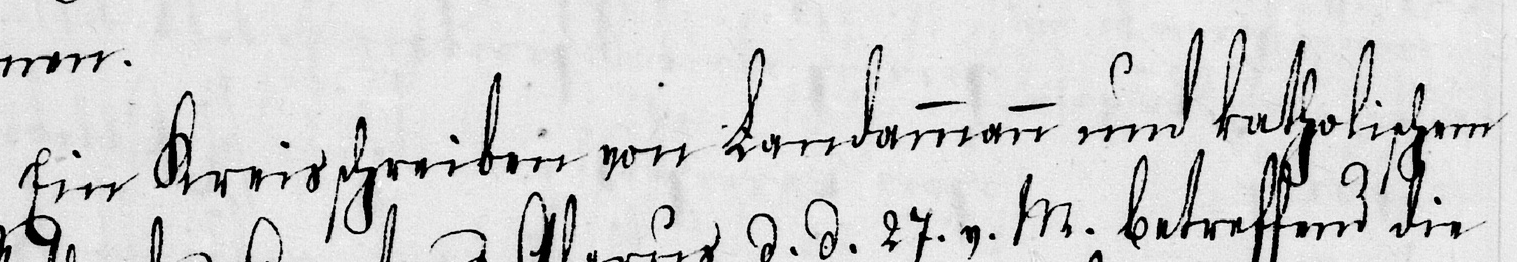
Ein Kreisschreiben von Landammann und katholischem
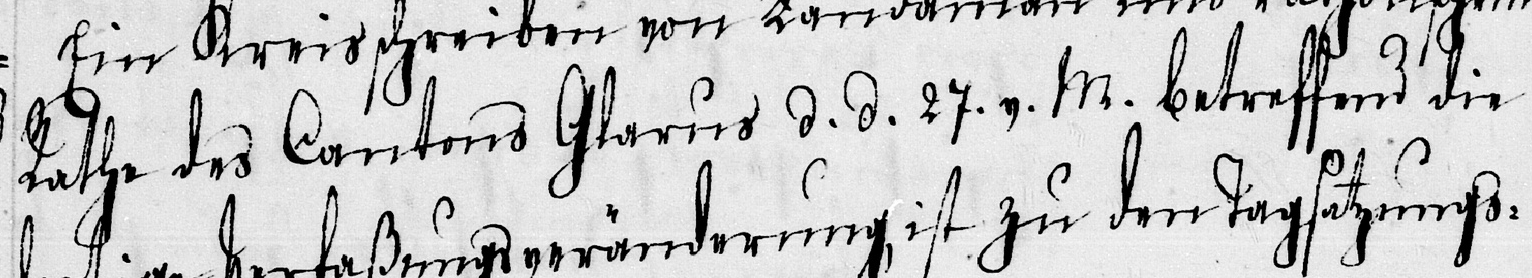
Rathe des Cantons Glarus d. d. 27. v. M. betreffend die
